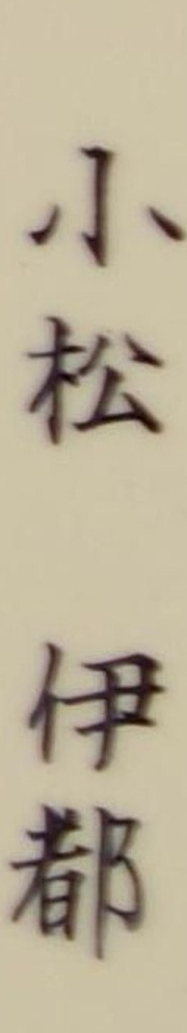小松伊都
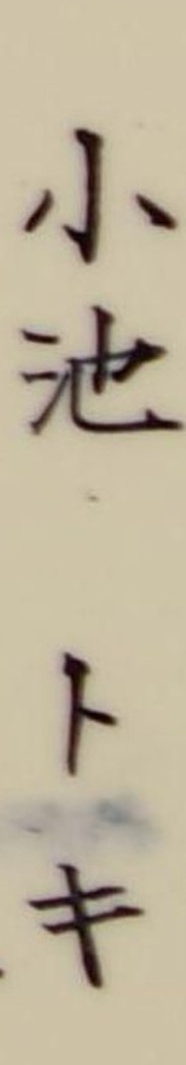小池トキ
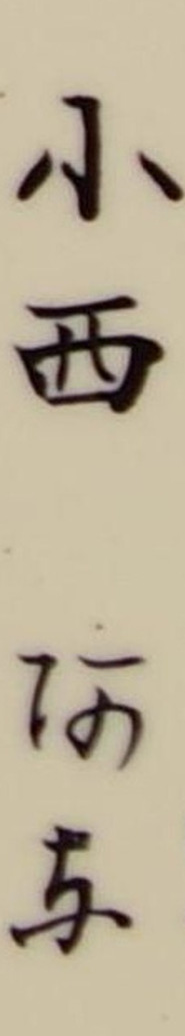小西あな
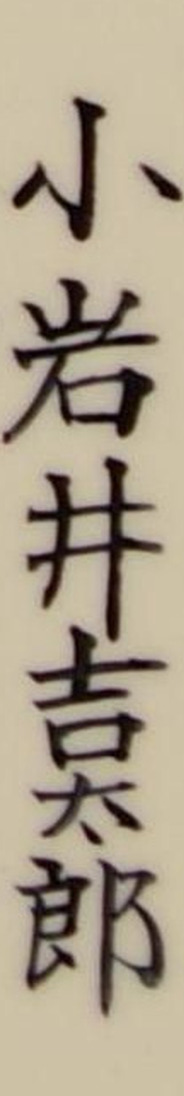小岩井吉太郎
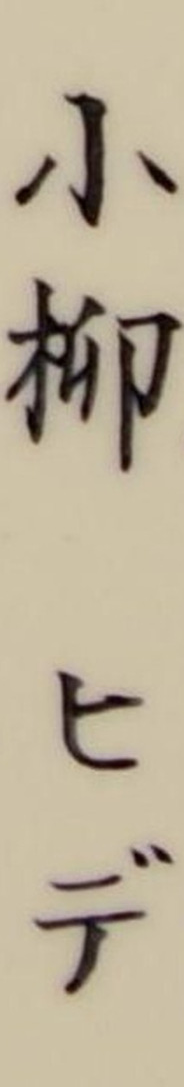小柳ヒデ
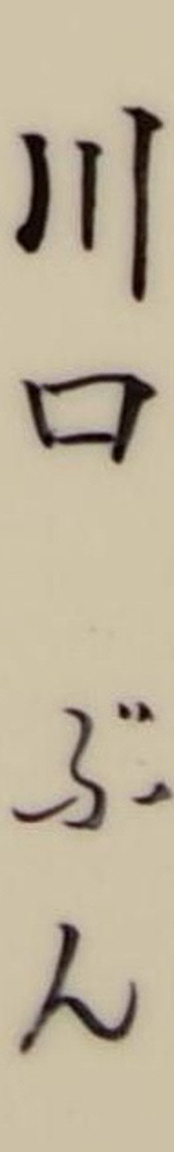川口ぶん
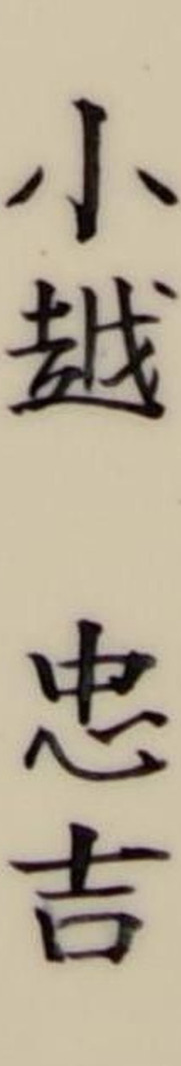小越忠吉
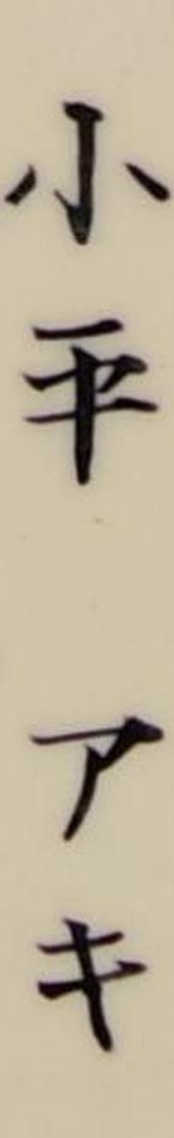小平アキ
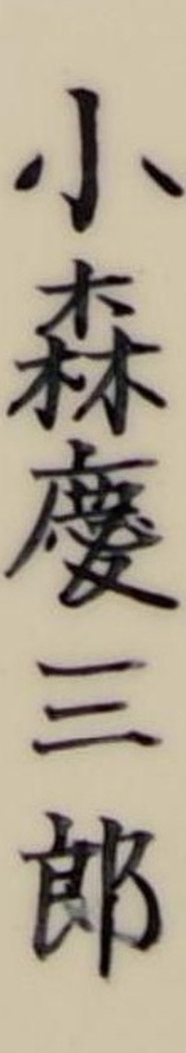小森慶三郎
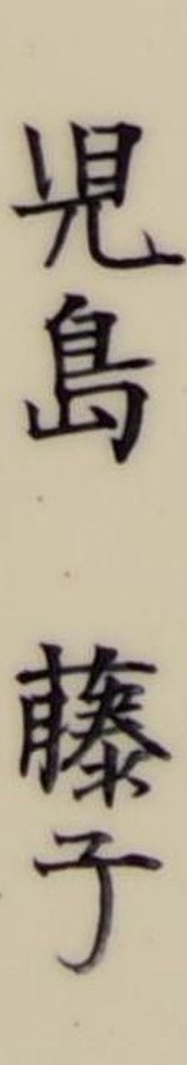児島藤子
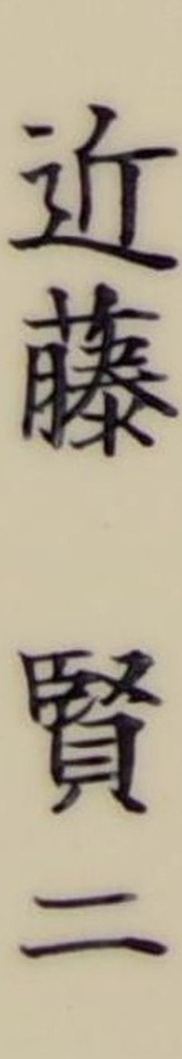近藤賢二
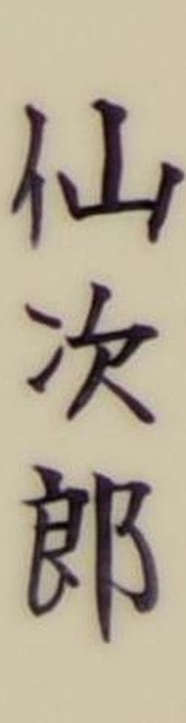仙次郎
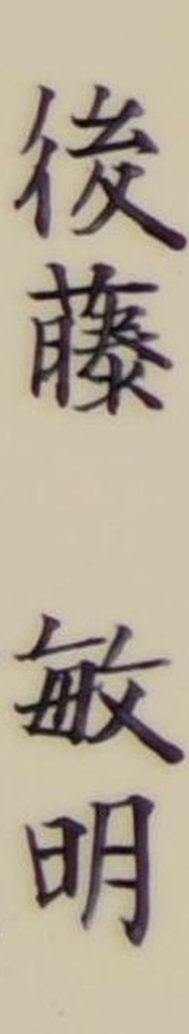後藤敏明

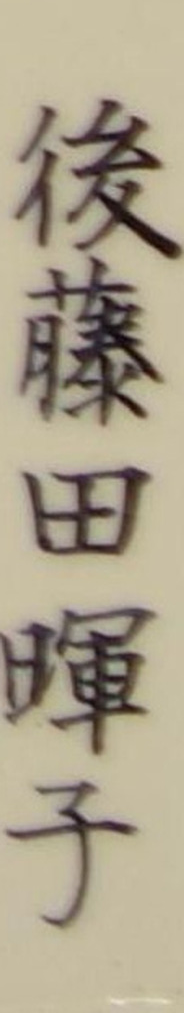後藤田暉子
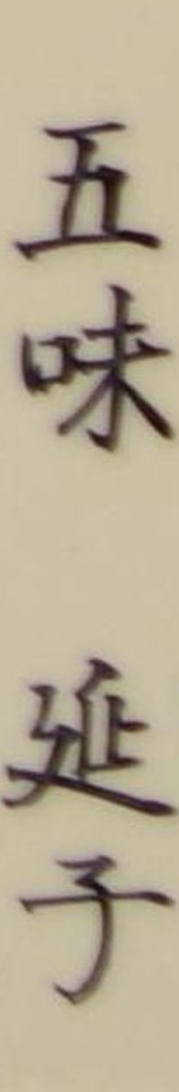五味延子
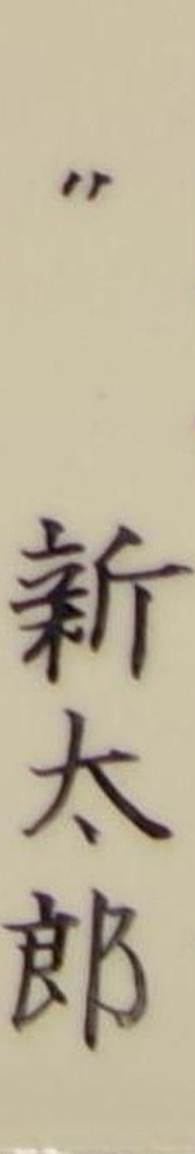新太郎
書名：E~L
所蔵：高野山金剛峯寺
